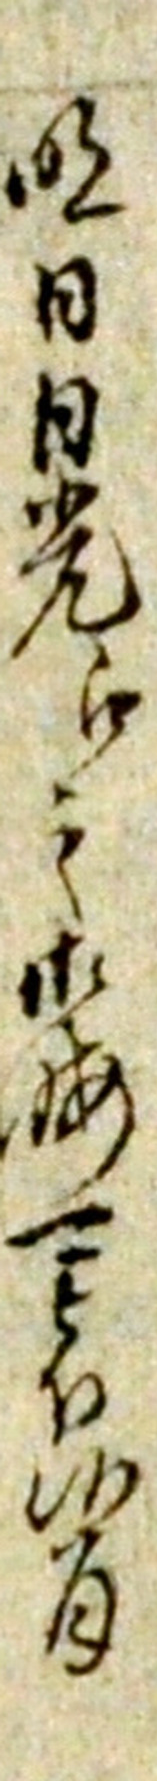明日日光江之御暇可被下候間
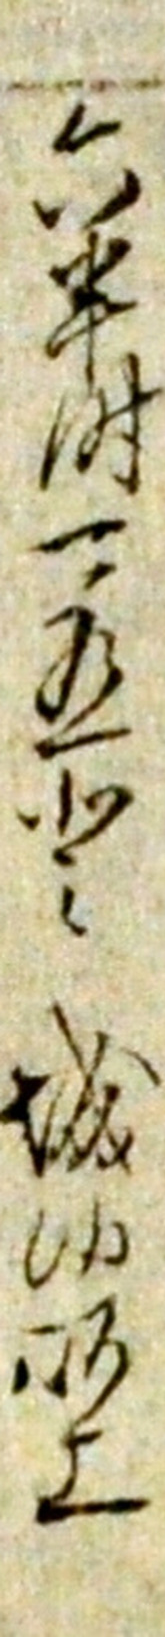六半時可有登城候以上
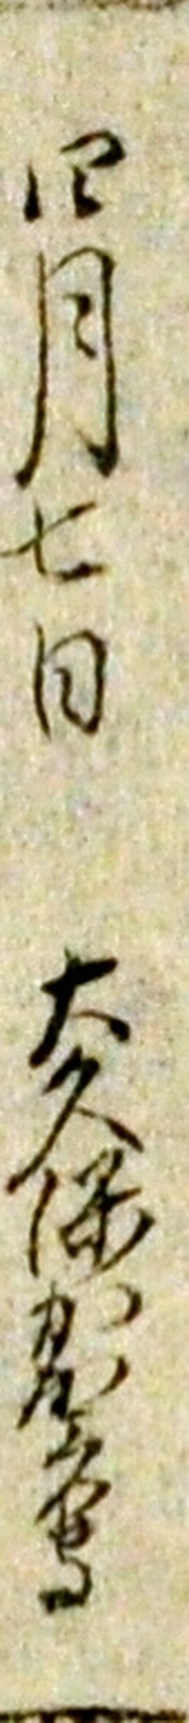四月七日大久保加賀守
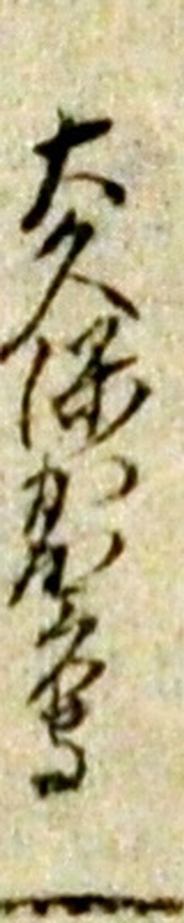大久保加賀守
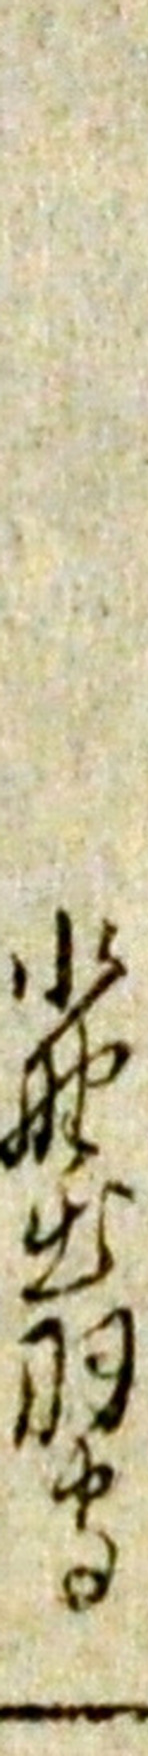水野出羽守
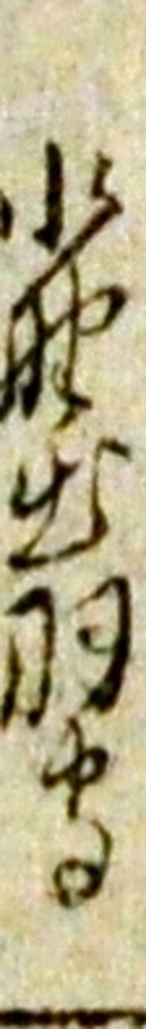水野出羽守
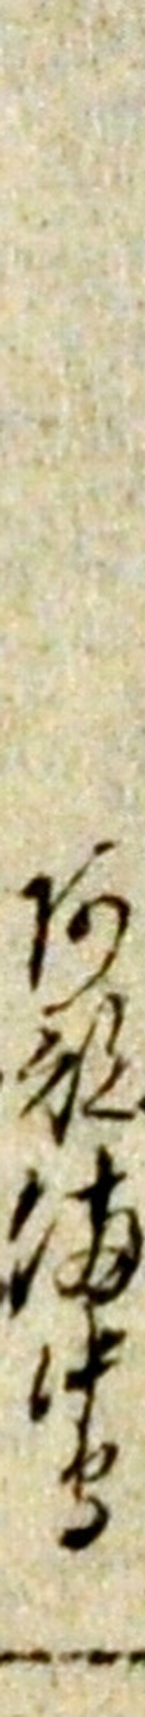阿部備中守
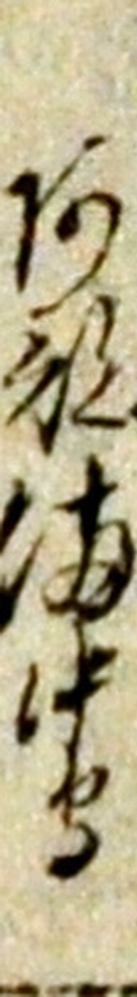阿部備中守
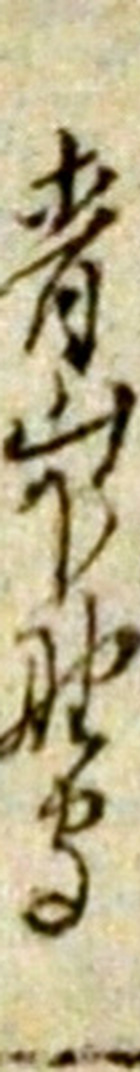青山下野守
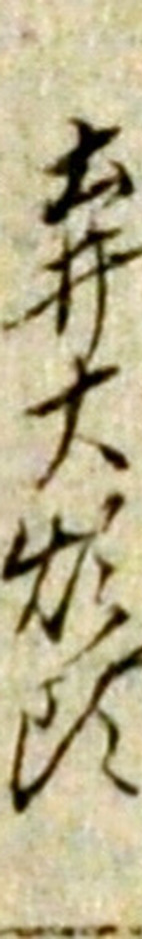土井大炊頭
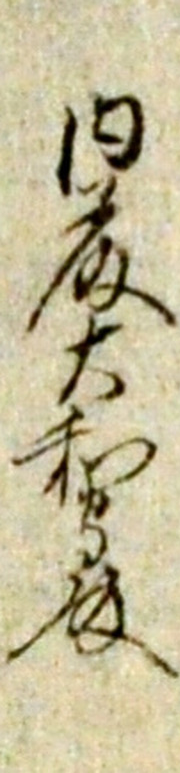内藤大和守殿
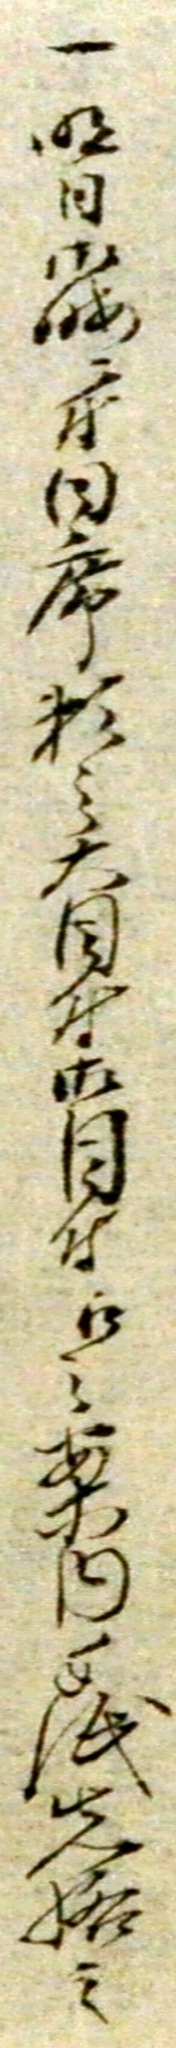一明日御暇ニ付同席頼之大目付御目付江之案内手紙先格之
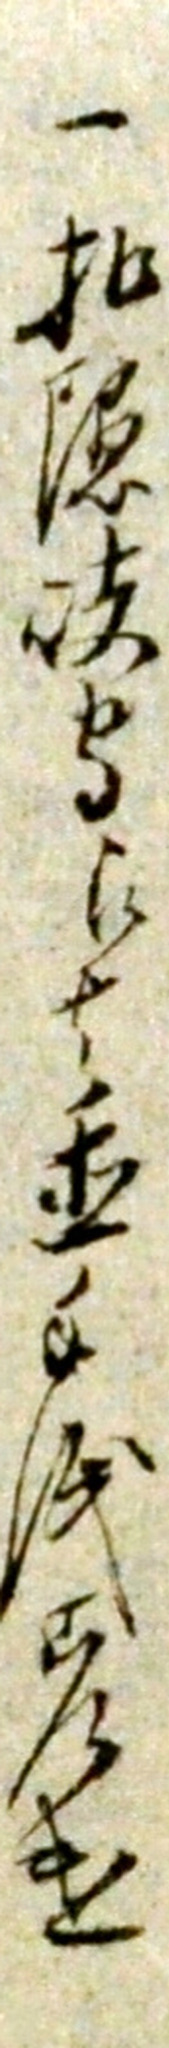一扣隠岐守江者置手紙差遣
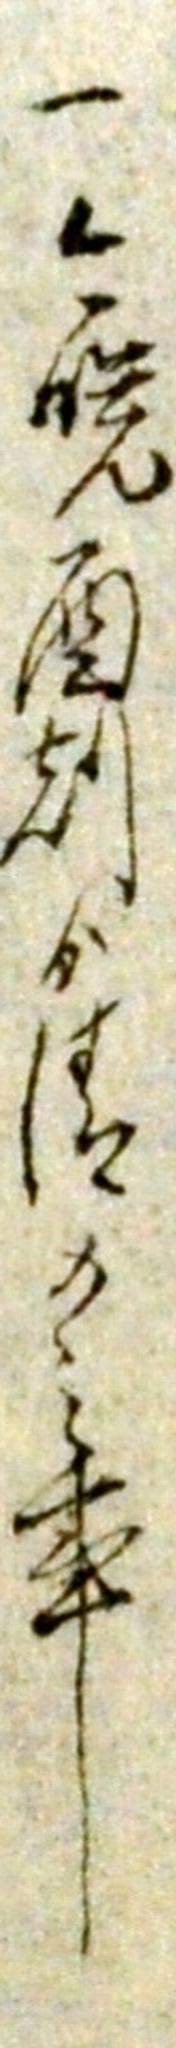一今暁酉刻ゟ清メ之事
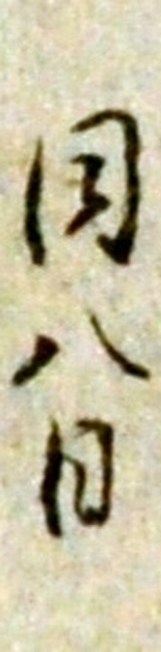同六日
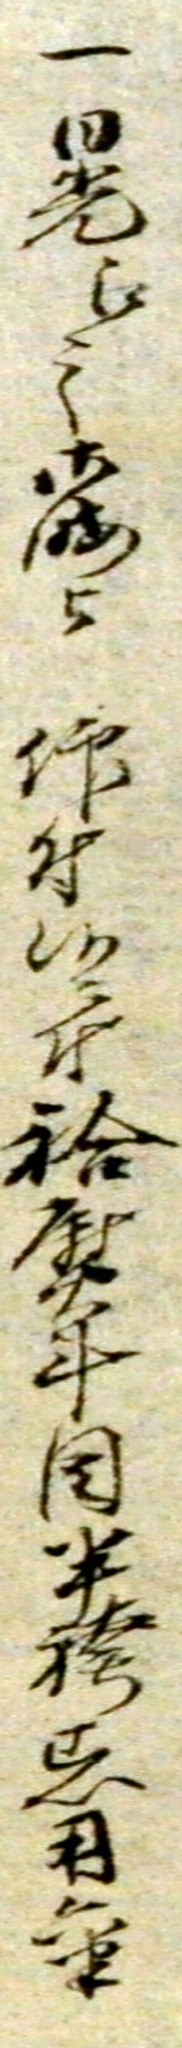一日光江之御暇ヒ仰付候ニ付袷熨斗目半袴着用六半
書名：日光御名代相勤候節ノ留
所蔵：伊那市立高遠町図書館・合同会社AMANE
